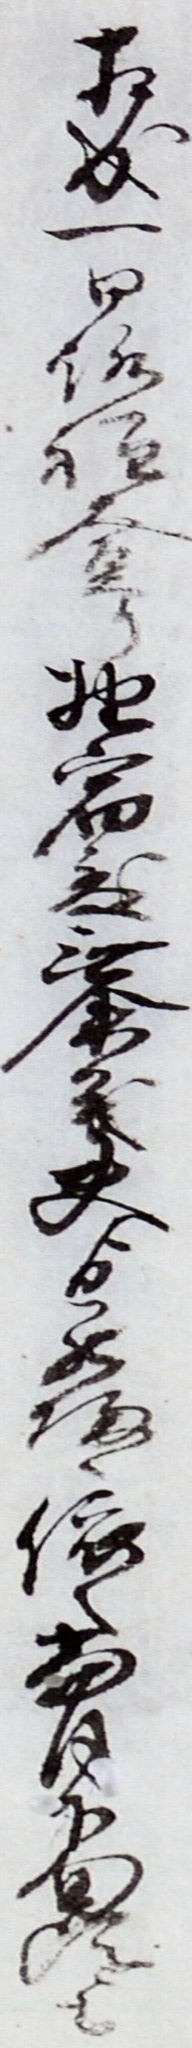相成一日作程登り野宿度無余義夫より罷帰候依之当月下旬頃も
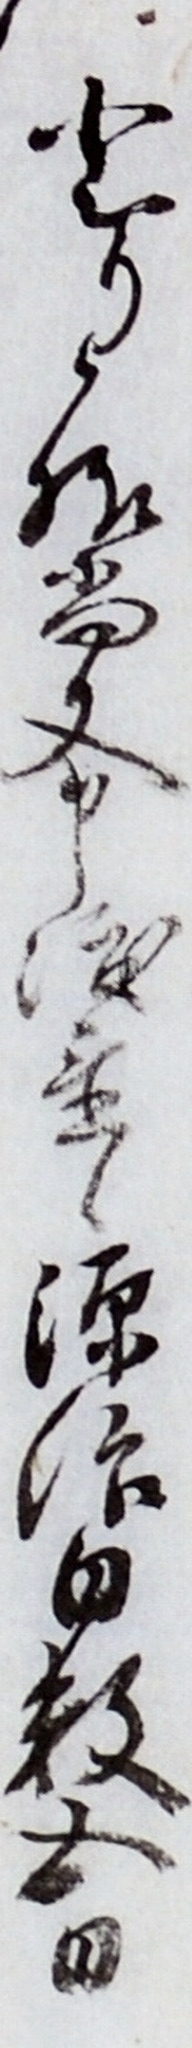一登り候様尚又申渡置候源治日数五日
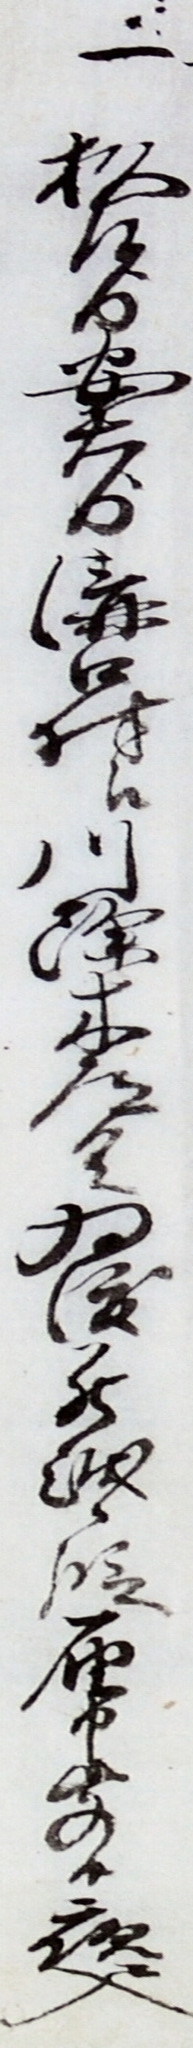一杉左衛門安左衛門溝口村江川除木道具為渡罷越候段届申聞候夜ニ入
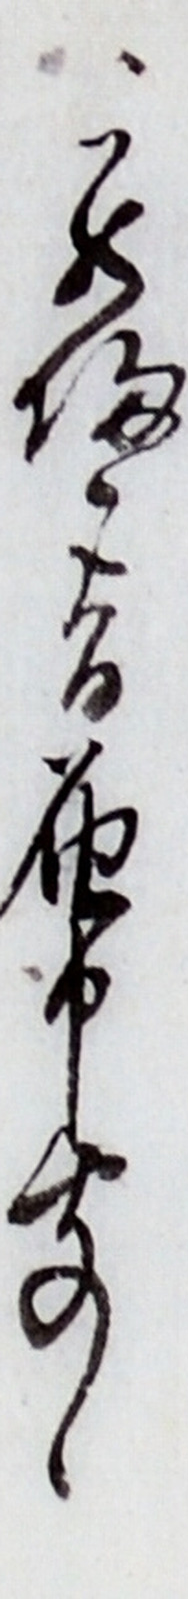罷帰候旨届申聞候

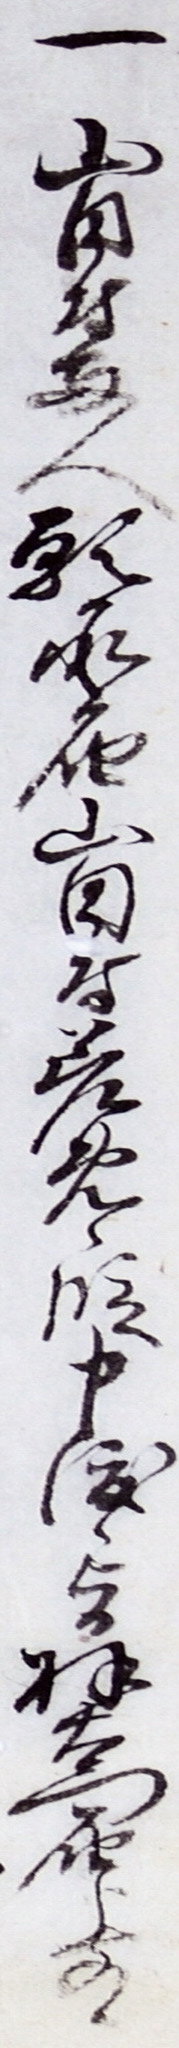一山目付両人願承届山目付差免候段申渡候旨羽右衛門届申聞候
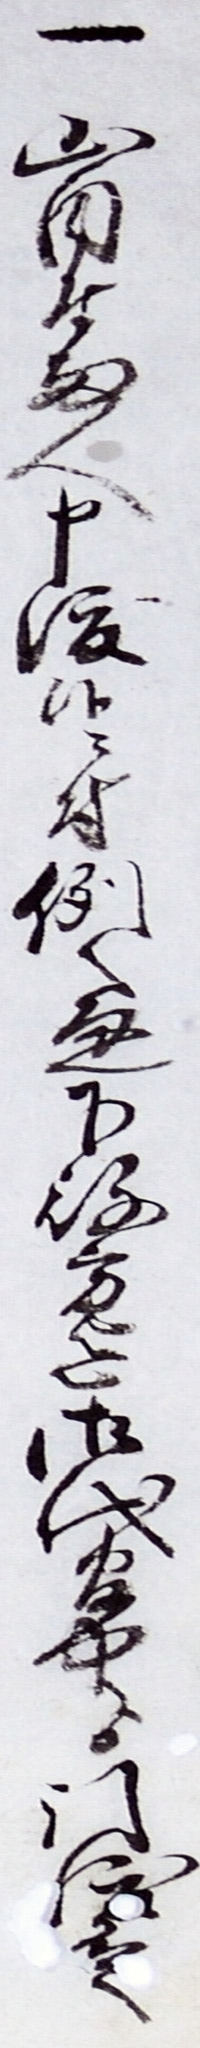一山目付両人申渡候ニ付例之通下役方迄御代官中より引渡置之
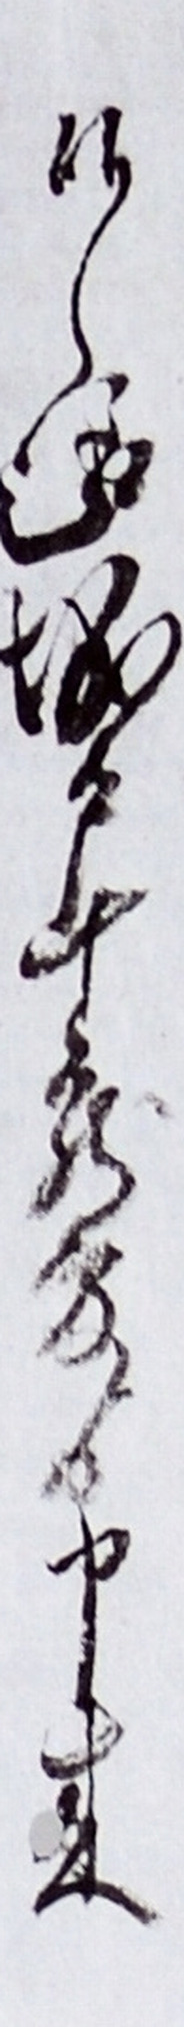候之趣城戸十蔵殿より申来
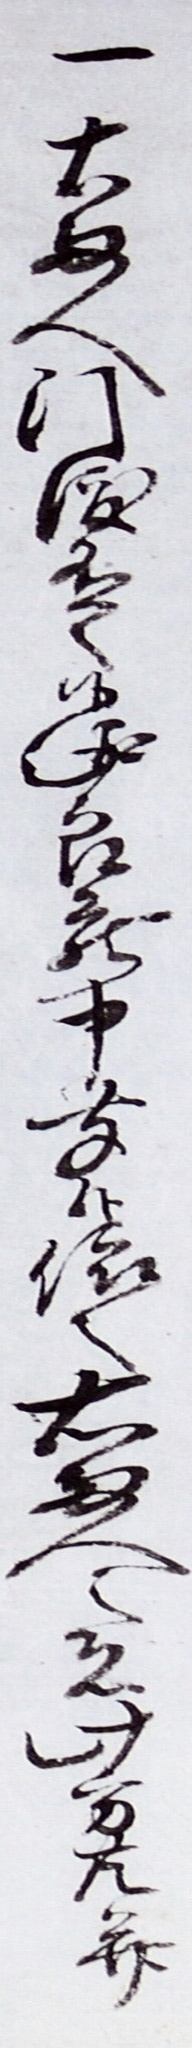一右両人引渡有之候趣節蔵申聞候依之右両人之者此方共并
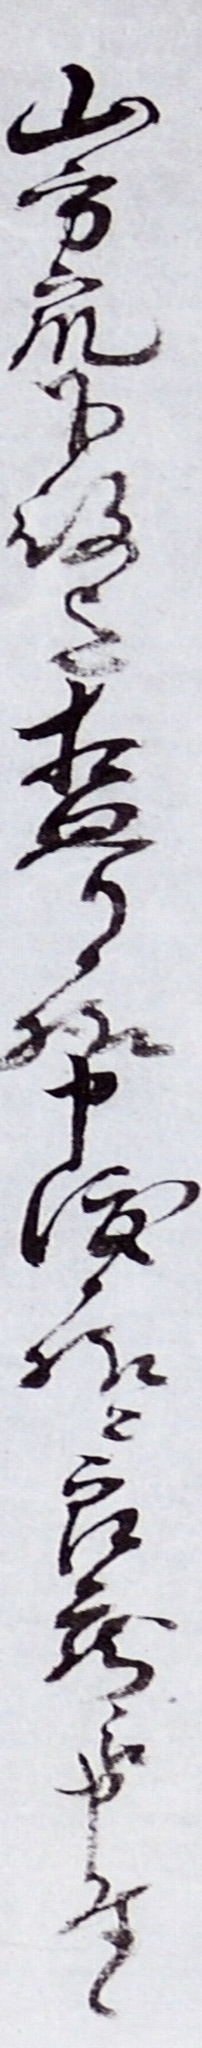山方衆下役迄相廻り候様申渡候様ニ而良蔵江申付候
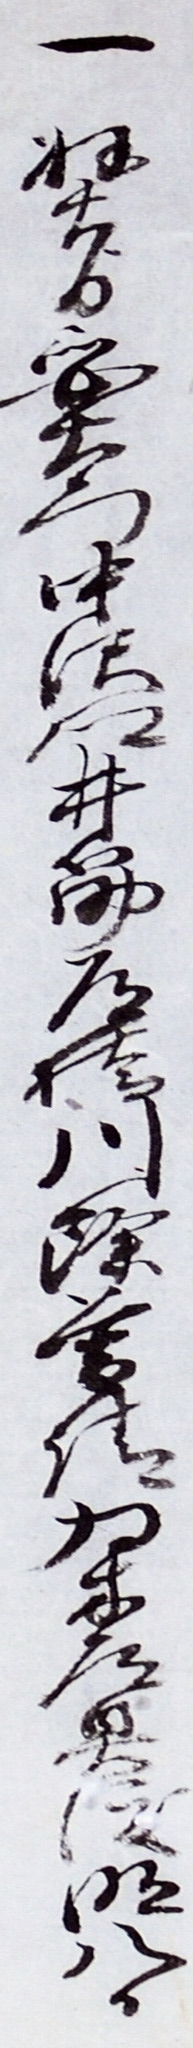一林太刀安右衛門中沢郷井筋道橋川除普請為木道具流明八日
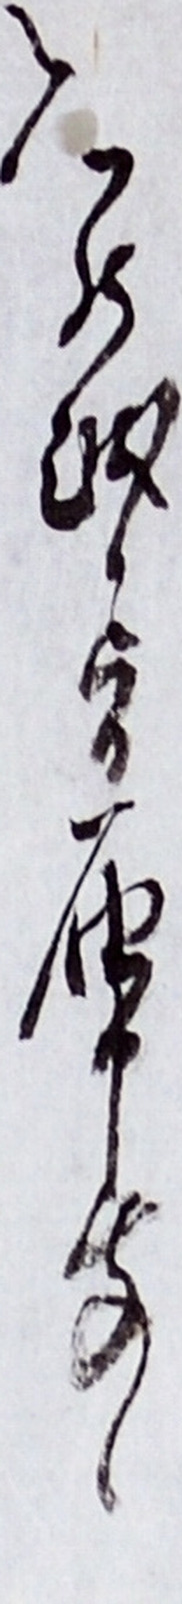罷越候旨届申聞候
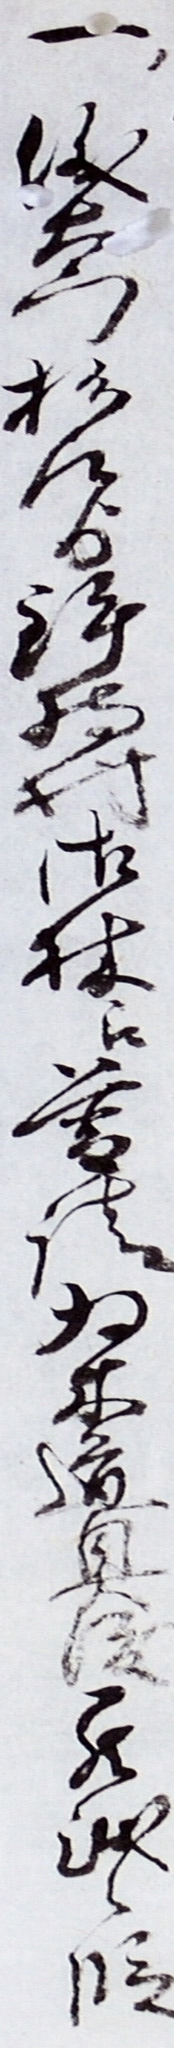一儀左衛門杉左衛門鉾持村御林江為普請木道具罷越候段
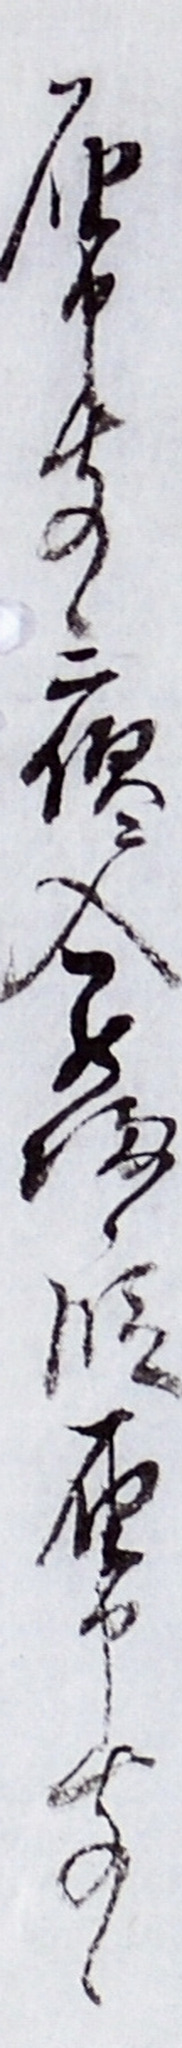届申聞候夜ニ入罷帰候段届申聞候
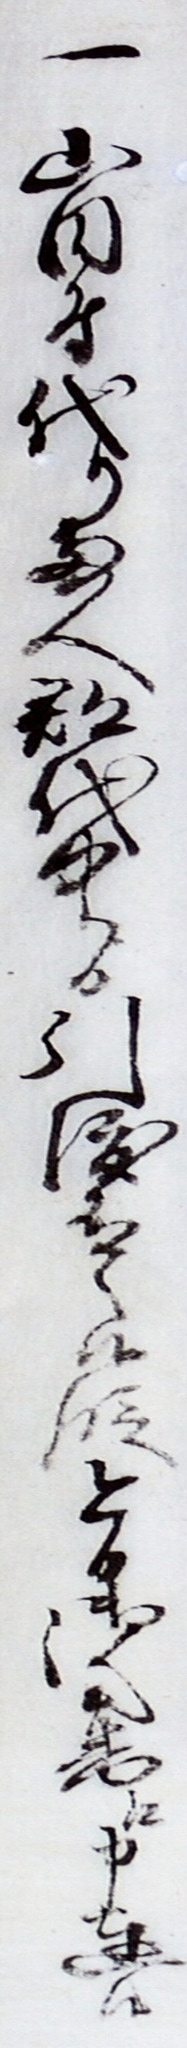一山目付代り両人郡代中より引渡有之候段今日御用番ニ申達候
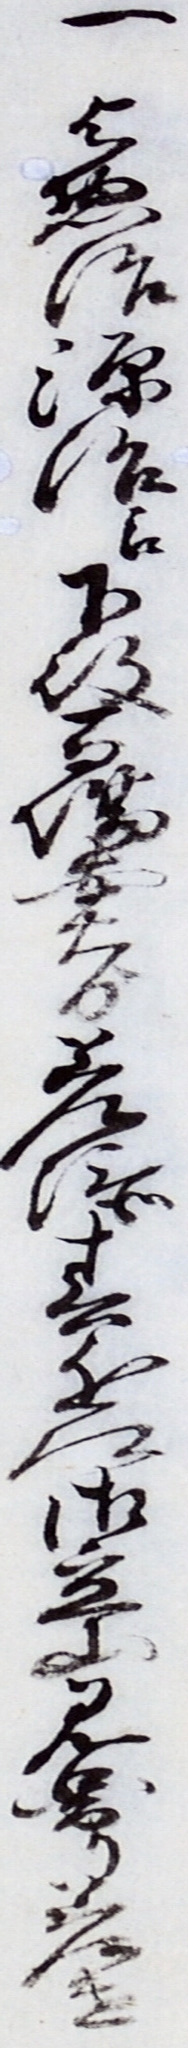一与惣治源治江下役馬場安左衛門より差添春近郷御立山見廻り差遣
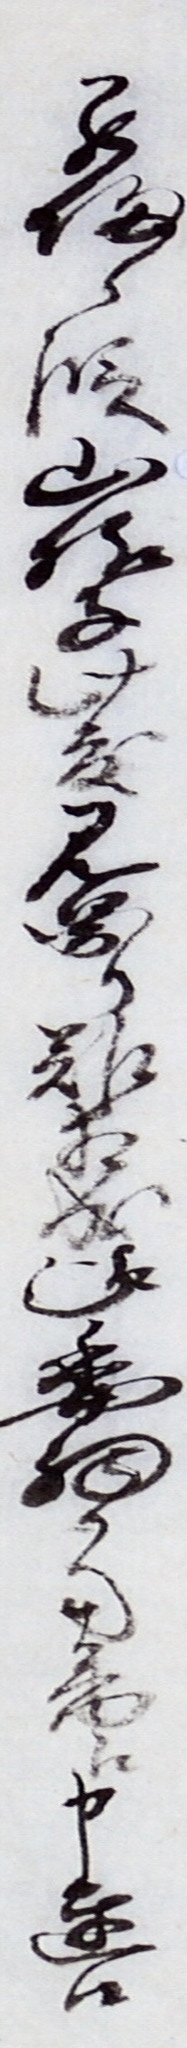罷帰候段山様子此度見図り難相成趣委細御用意江申達候
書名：御山奉行御用控
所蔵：伊那市立高遠町図書館・合同会社AMANE
